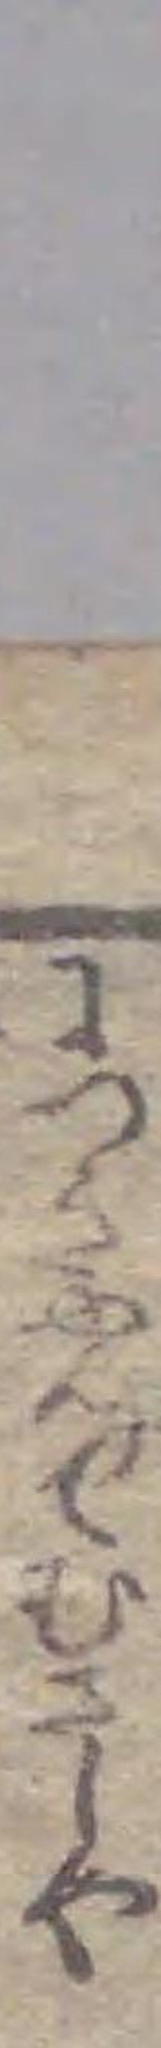につきやつてむさしや
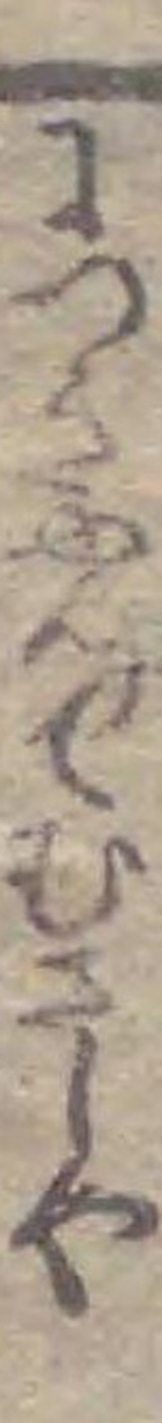につきやつてむさしや
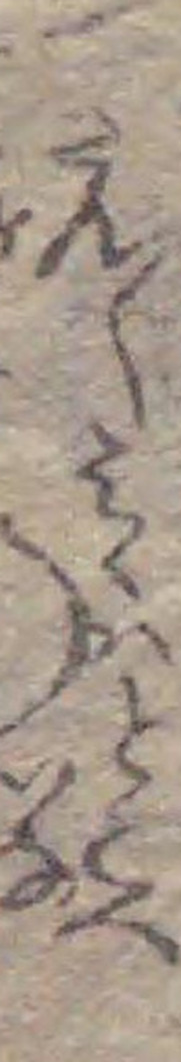さん〳〵みゝはとこへ
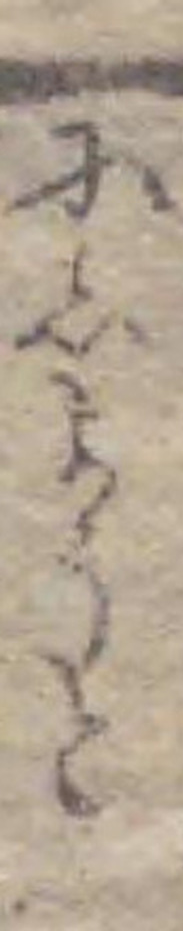にしようと
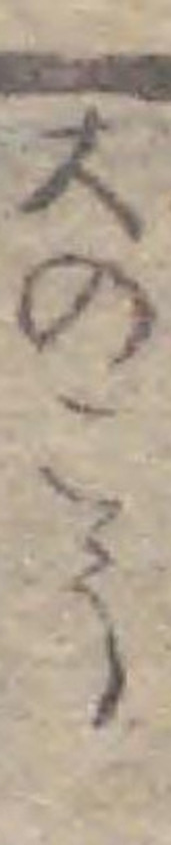大のこう
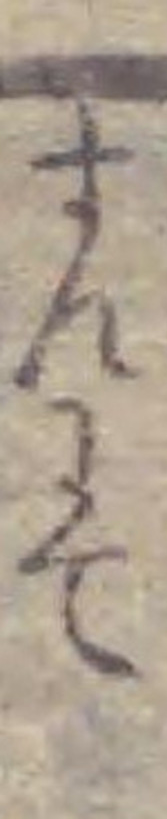まんにて
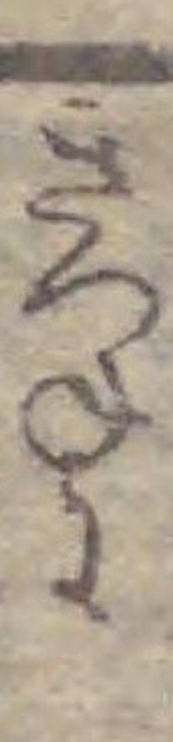きつねに
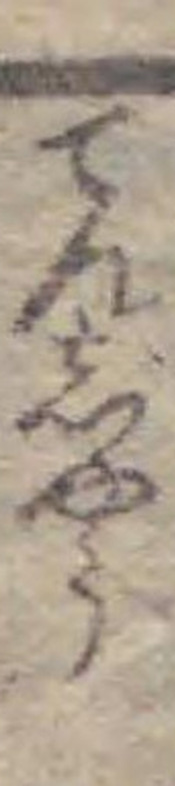てんじやう
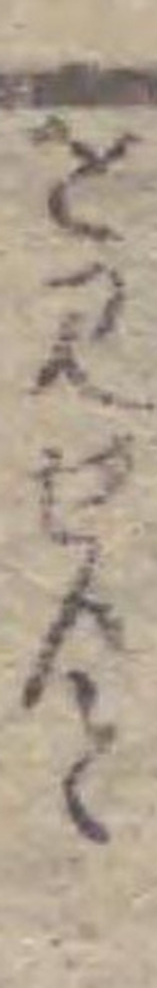を見せんと
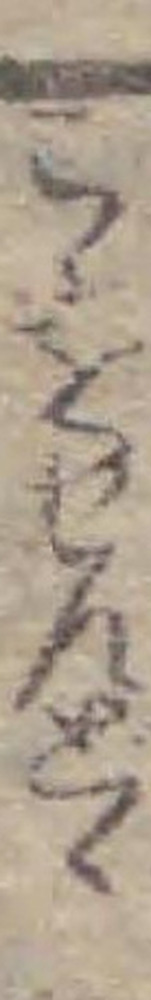こゝをせんどゝ
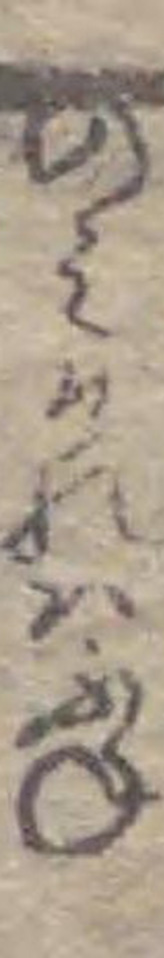のみけれはふね
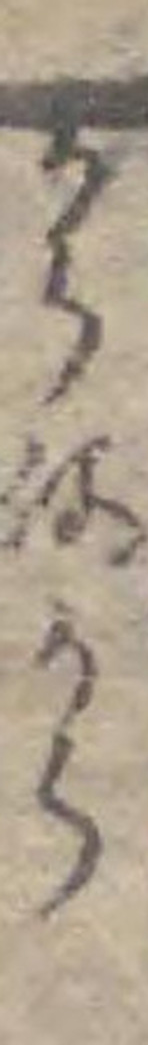から何から
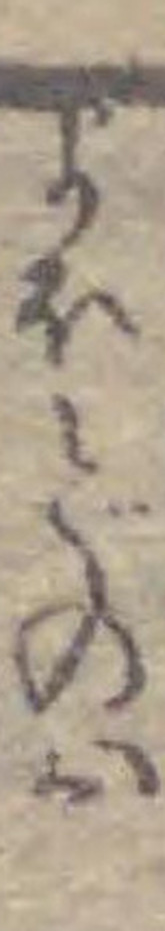よほどのお
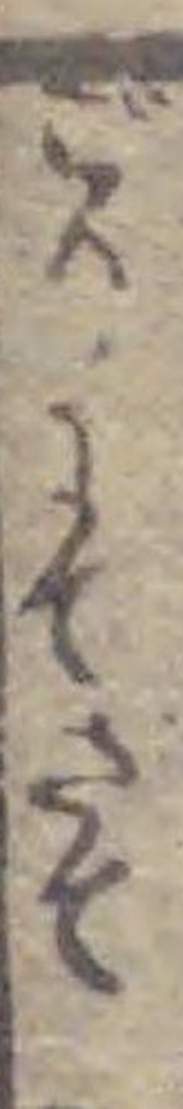ごりにてさて
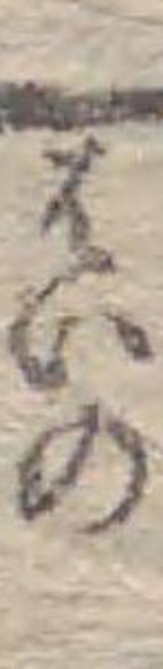はいの
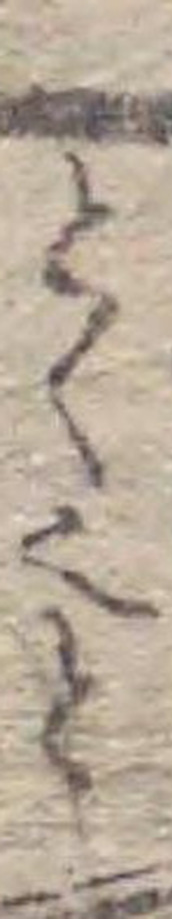とく也と
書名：紺屋百物語 : 3巻
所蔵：国立国会図書館 National Diet Library, JAPAN
